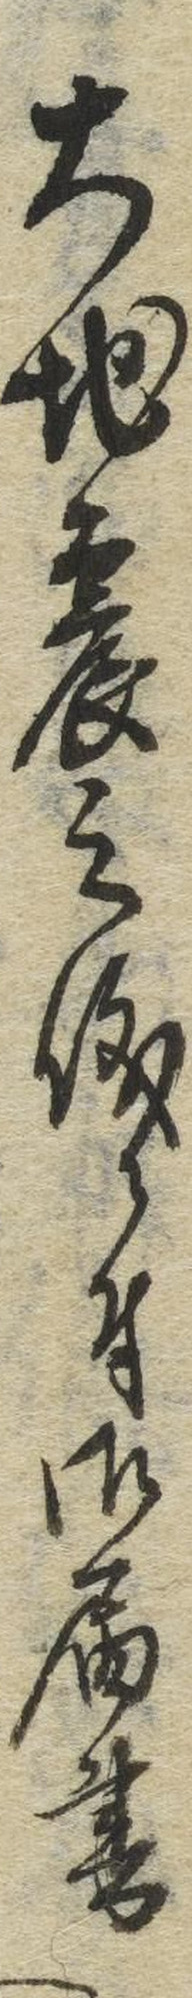大地震之儀二付御届書
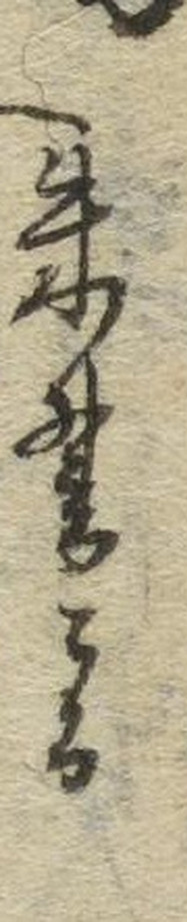朱書二而
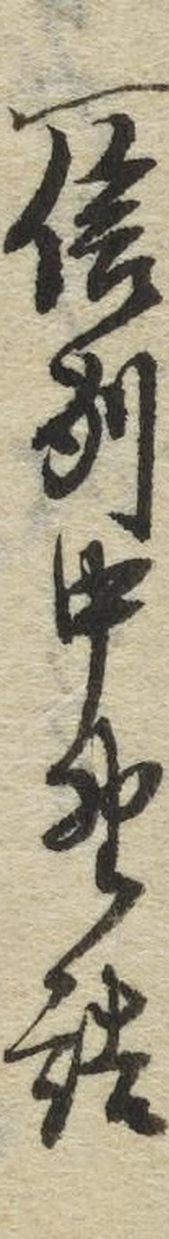信州中野詰
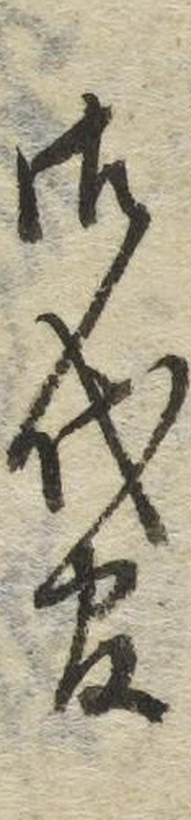御代官
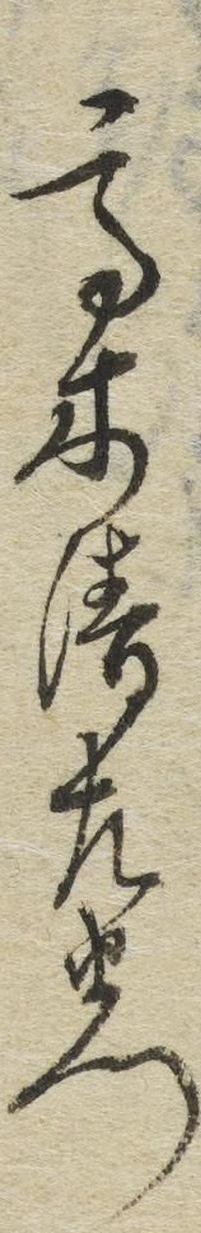高木清左衛門
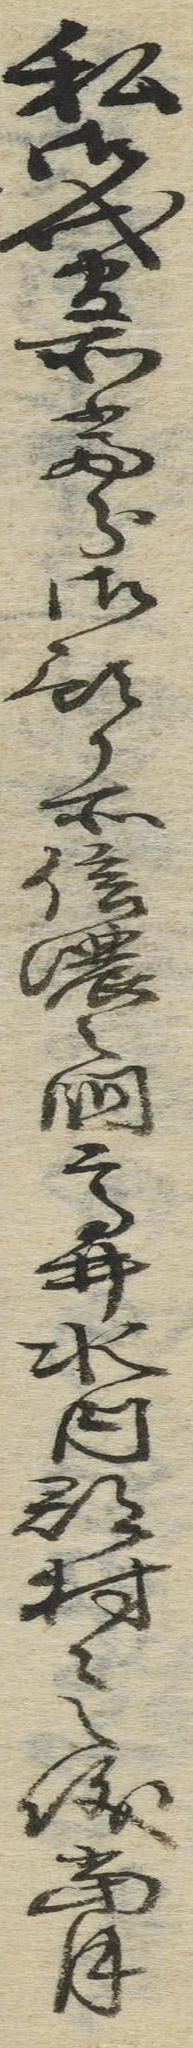私御代官所当分御預所信濃之国高井水内郡村々之儀当月
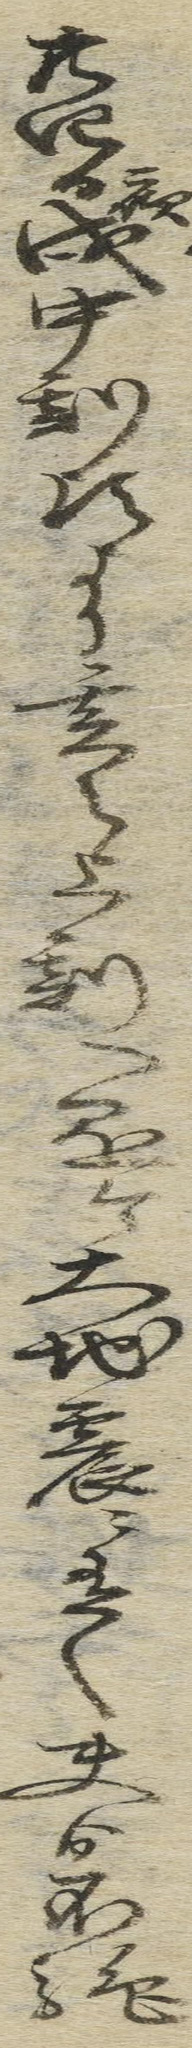廿四日夜戌中刻頃より亥上刻へ懸ヶ大地震二有之夫ゟ不絶
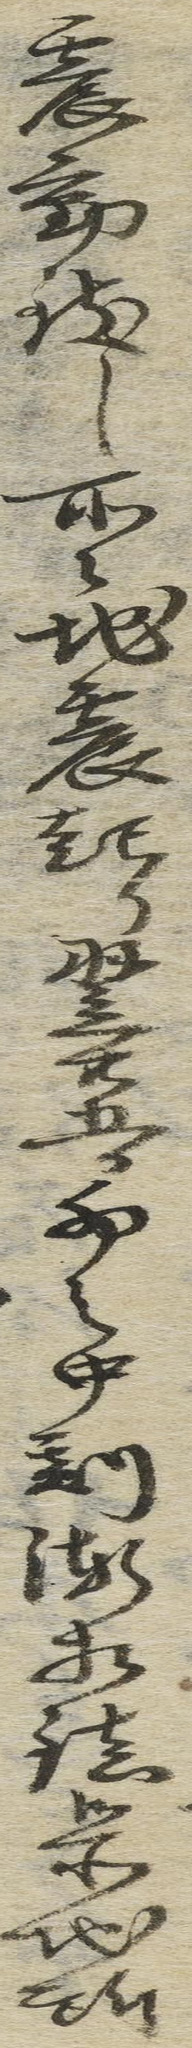震動致し所々地震起り翌廿五日卯之中刻漸々相鎮候所地所
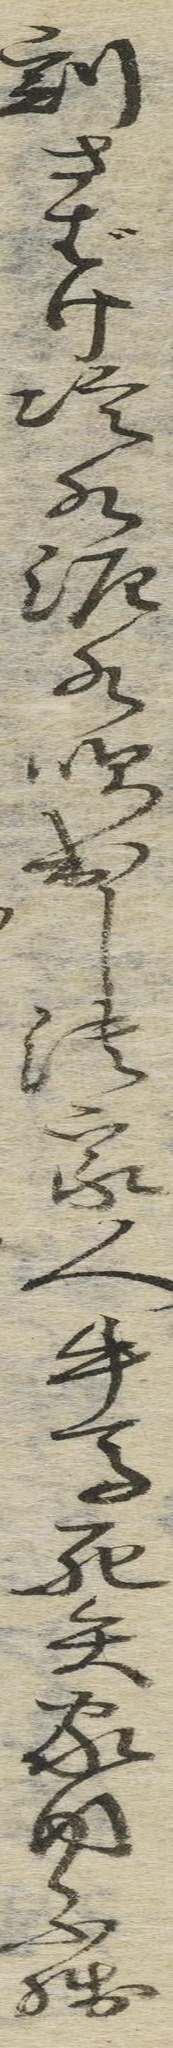割さばけ冷水泥水吹出し潰家人牛馬死失家内不残
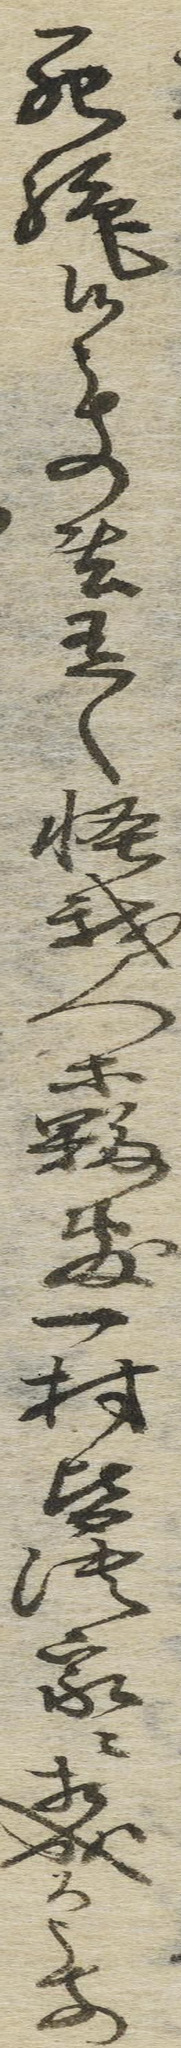死絶候もの多有之怪我人等夥敷一村皆潰家二相成り候もの
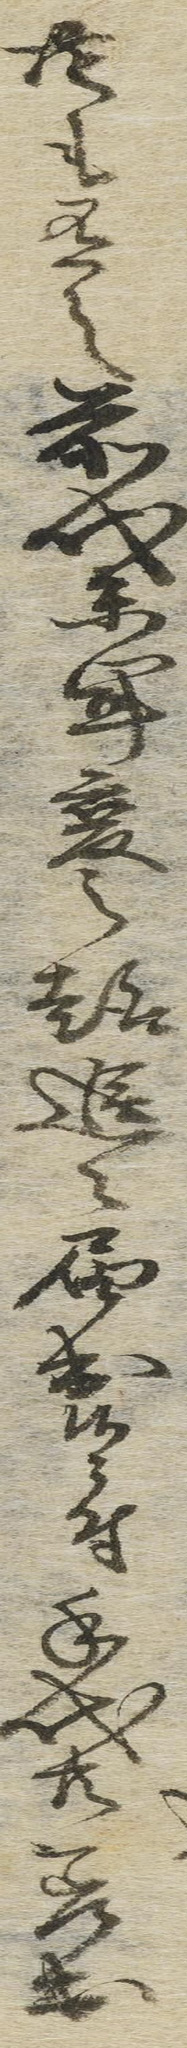共も有之前代未聞変之趣追々届出候二付手代共差出
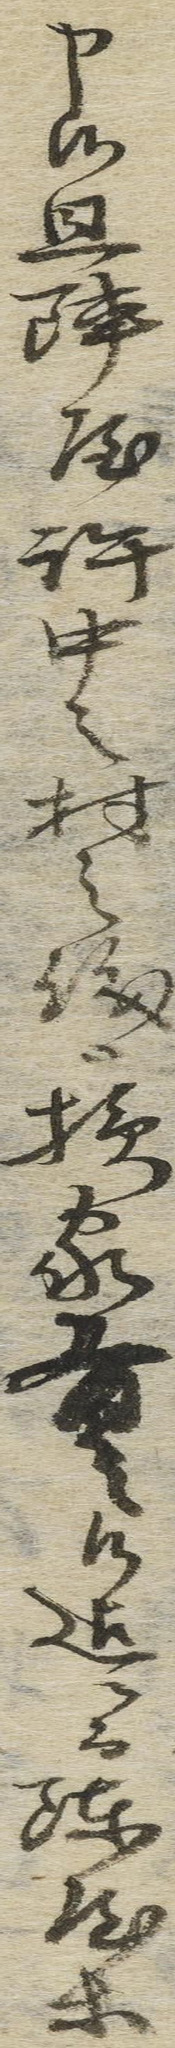申候且陣屋許中之村之儀ハ損家有之候迄二而陣屋等
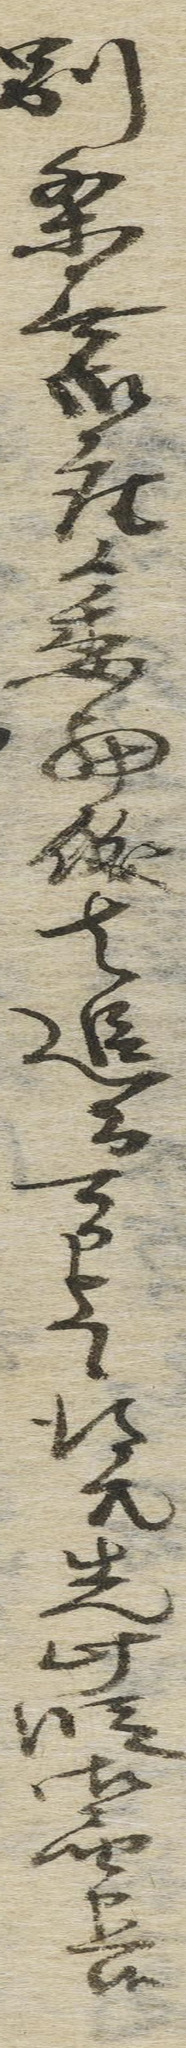別条無御座候委細儀は追而可申上候得共先此段御届申上候
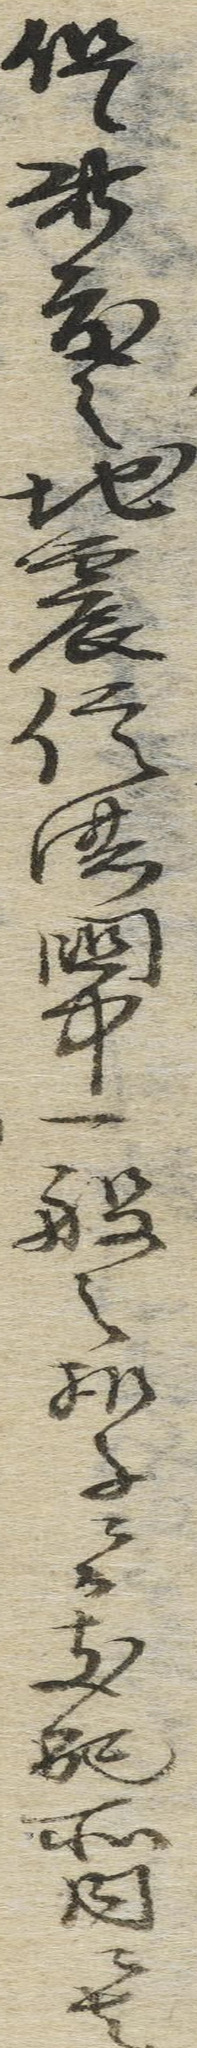但し此度之地震信濃国中一般之様子二而支配所内二は
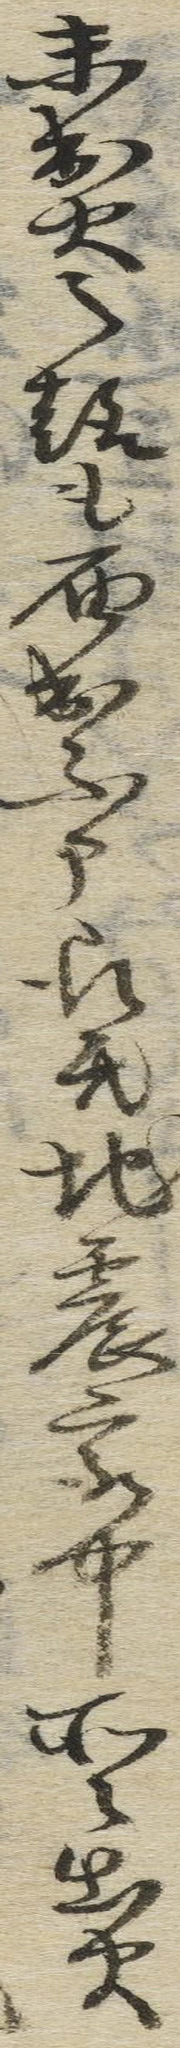未出火之趣も届出不申候得共地震最中所々出火
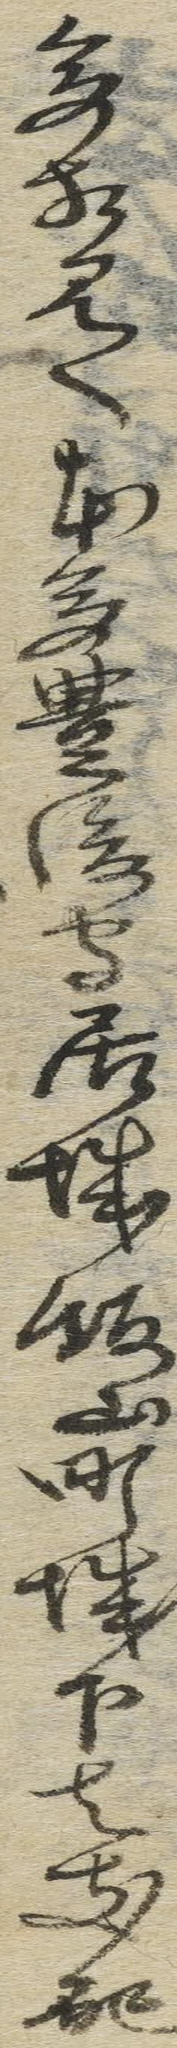多相見へ本多豊後守居城飯山町城下は支配
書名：信濃越後　地震書留
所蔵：東京大学地震研究所図書室 Earthquake Research Institute Library, The University of Tokyo, JAPAN
